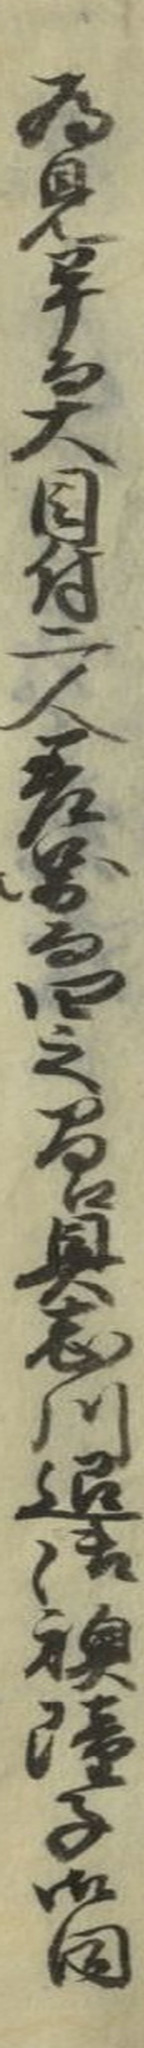為見畢而大目付二人指図而四之間え具志川退御襖障子御同
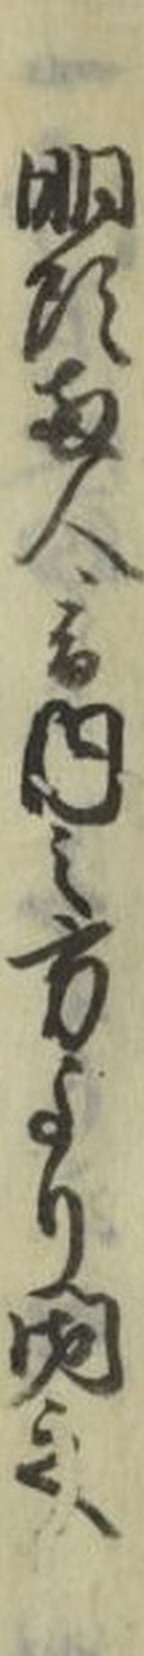朋頭両人に而内の方より閉之
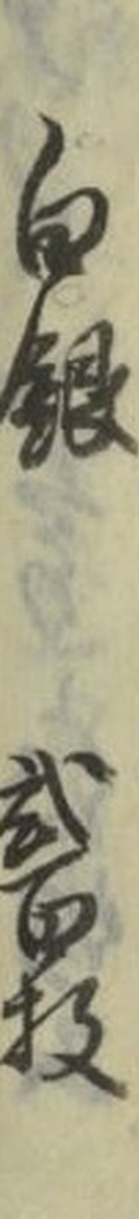白銀五百枚
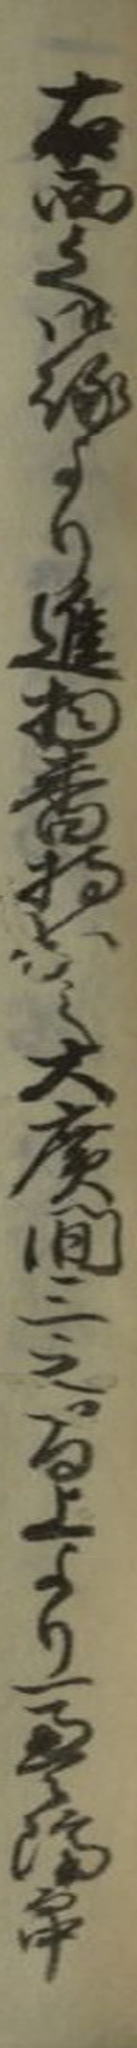右西之御縁より進物番持出之大広間三之間上より一畳隔而中
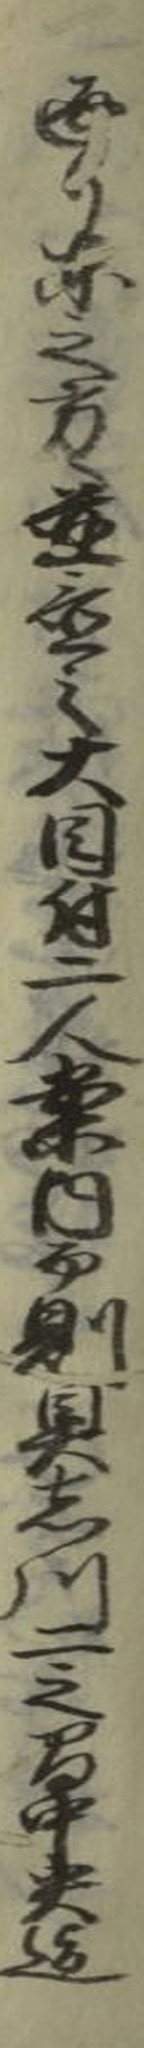通り東之方へ並置之大目付二人案内而則具志川ニ之間中央迠
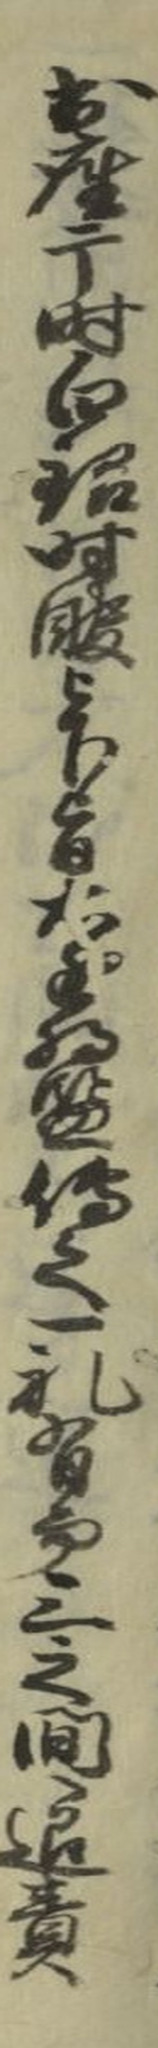出座于時白銀時服被下旨右近将監伝之一礼有而三之間へ退責
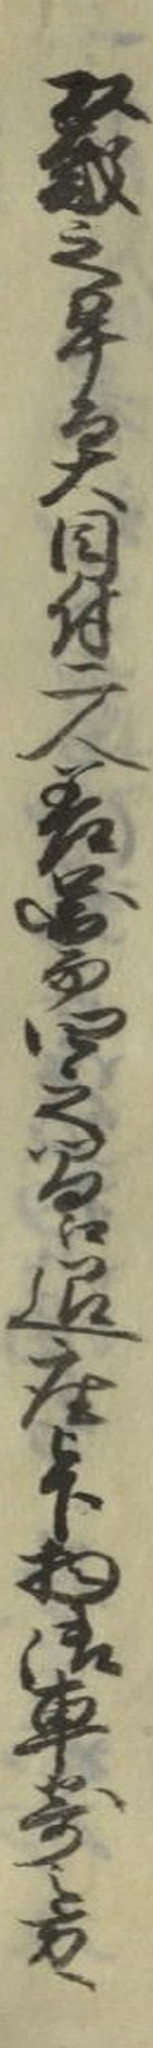双叡之畢而大目付二人差図而四之間え退座被下物御車寄之方へ
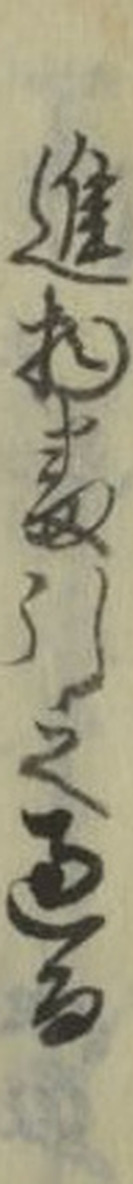進物番引之通而
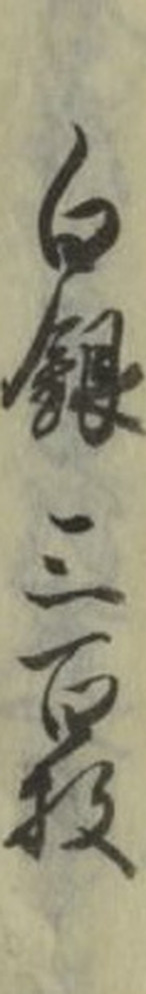白銀五百枚
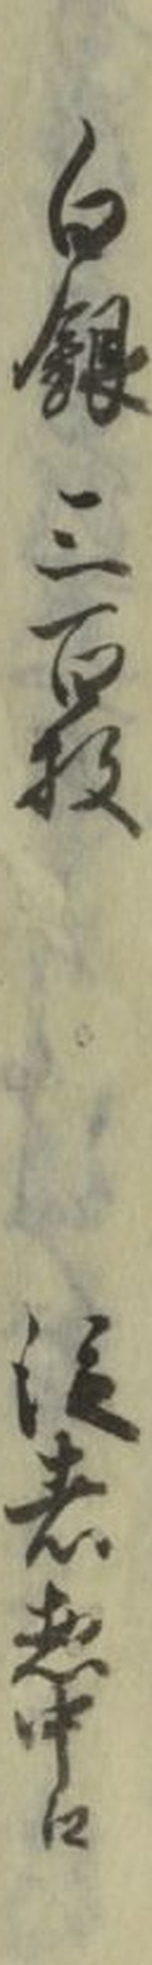白銀三百枚従者惣中
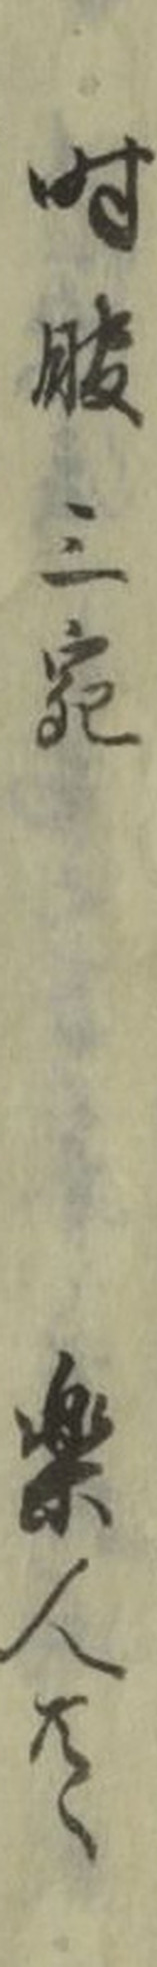時服三宛楽人共へ
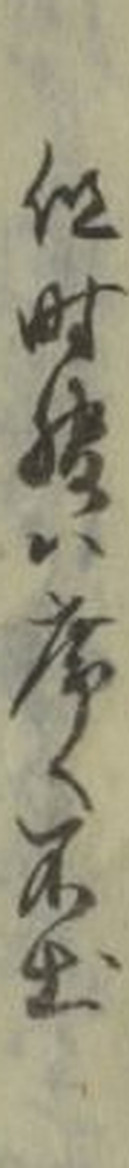但時服は広く不出
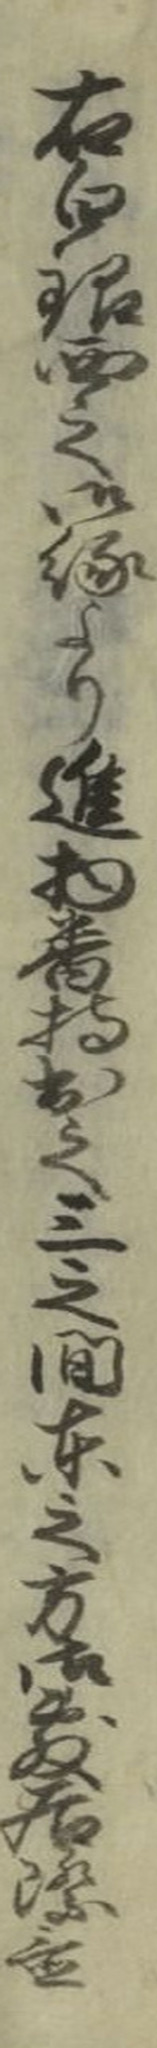右白銀西之御縁より進物番持出之三之間東之方御敷居際置
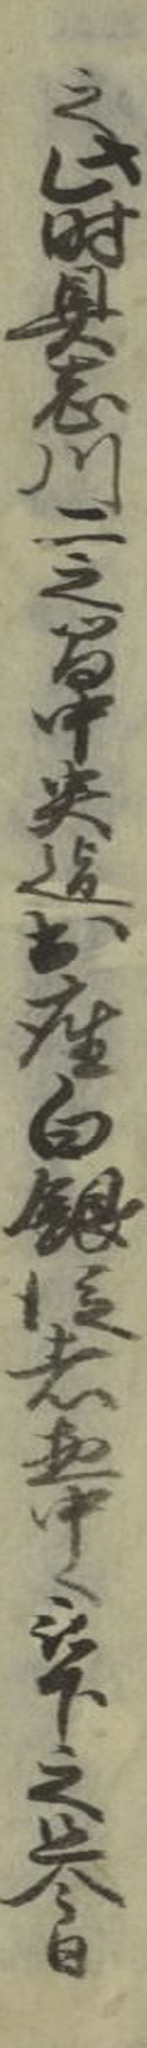之此時具志川ニ之間中央迠出座白銀従者惣中へ被下之且今日
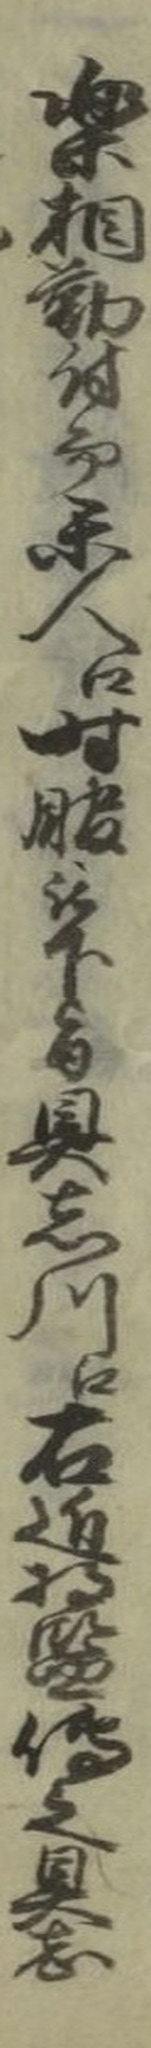楽相勤付而楽人え時服被下旨具志川え右近将監伝之具志
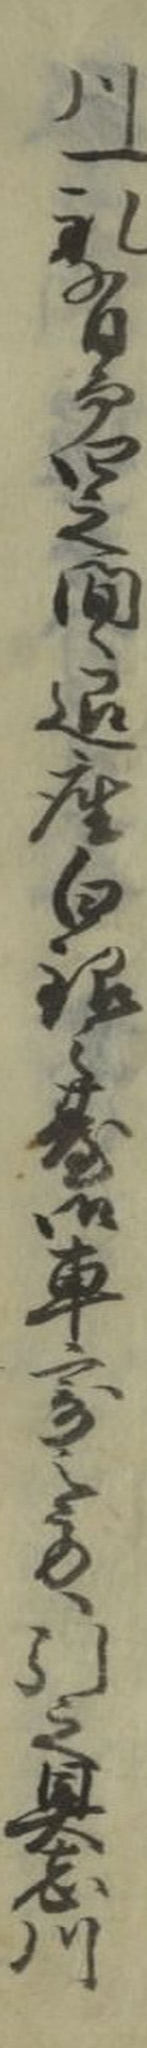川一礼有而四之間へ退座白銀之臺御車寄之方へ引之具志川
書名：琉球人来朝之記
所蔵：University of the Ryukyus Library
